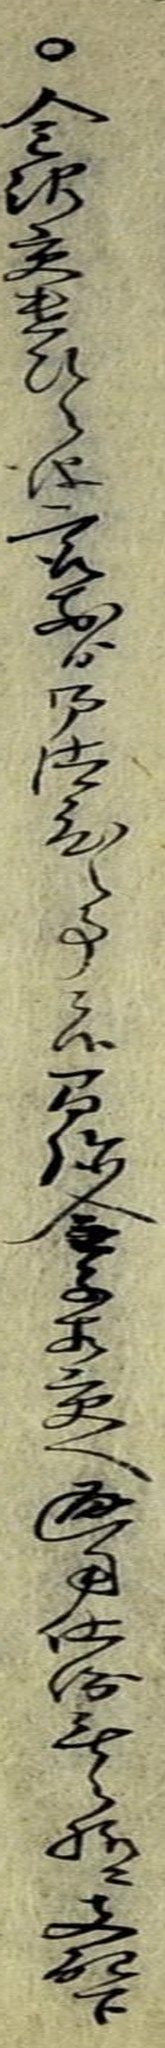〇金銀交遣ひ之儀最前ゟ御法度之事に候間弥金子相交へ通用仕儀無之様に支配下
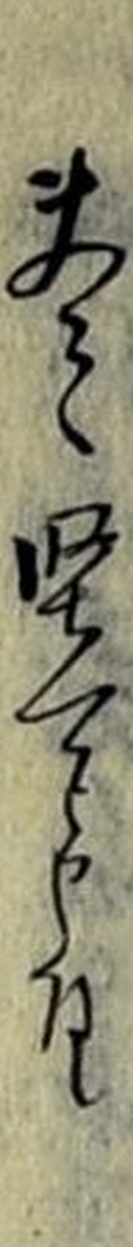夫々へ堅可被申付候
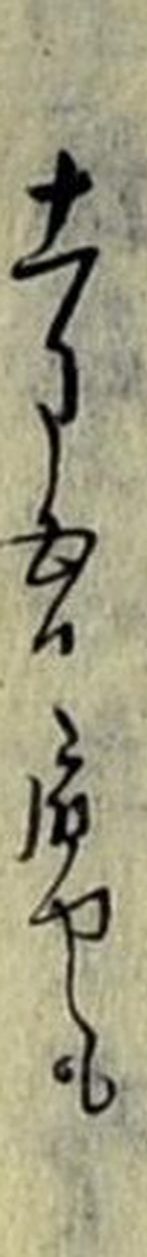十一月五日府中も
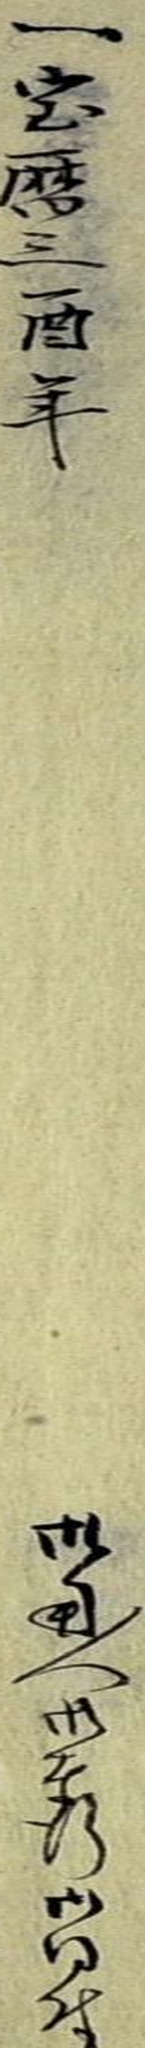一宝暦三酉年御用人御奉行御目付へ
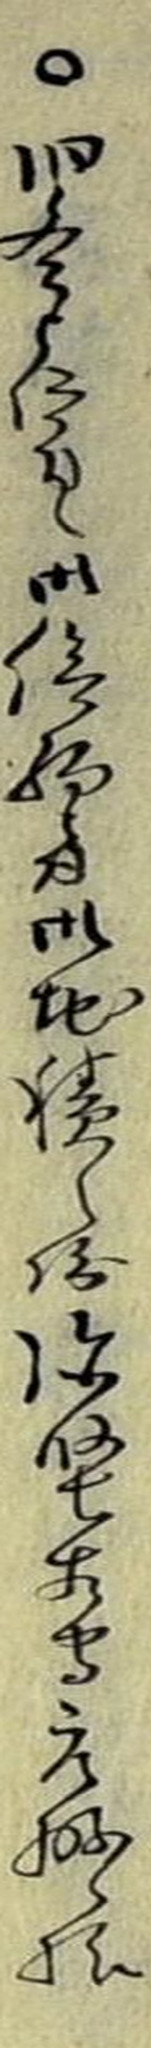〇旧冬被仰付候御倹約に付御地積之儀弥堅相守取扱候様
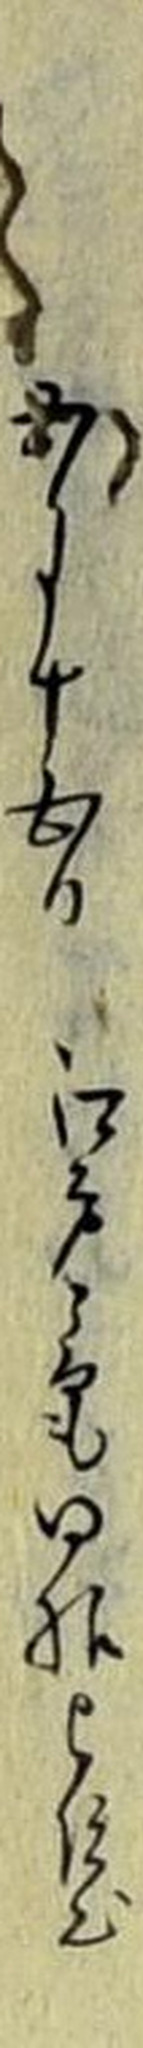五月十五日江戸に而も同様被仰出
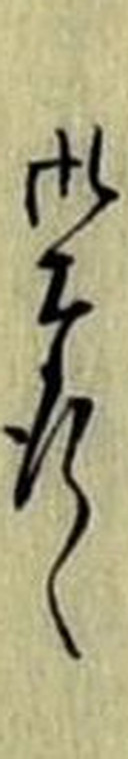御奉行へ
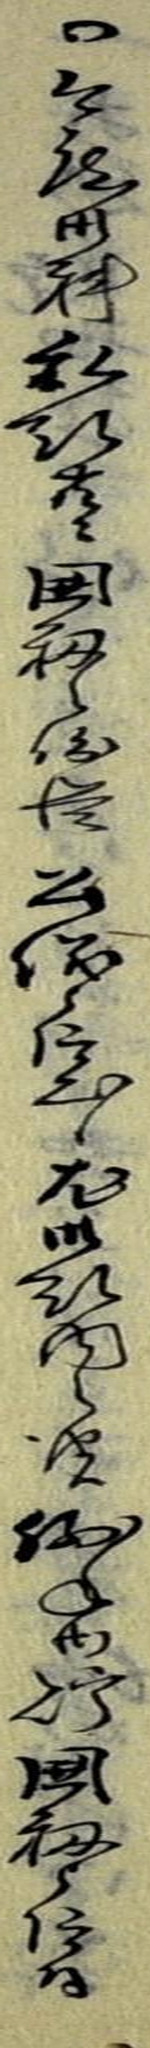〇今度御料私領共に囲籾之儀従公儀被仰出候尤御領内之儀は例年御貯囲籾被仰付
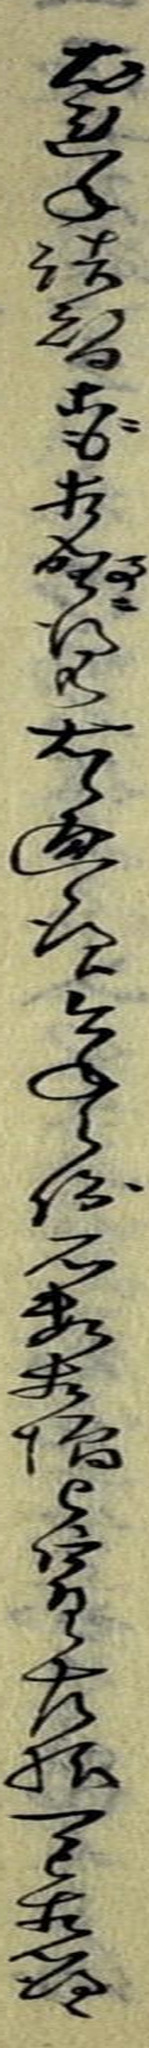尤連年詰替等にも相成事に候得共右之通候得は今年之儀石数相増被仰付候左様可被相心得候
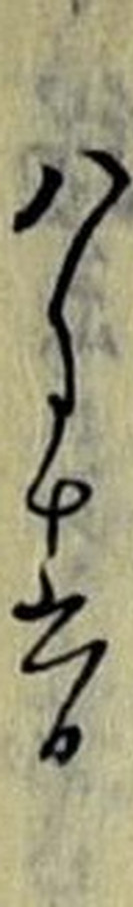八月十六日
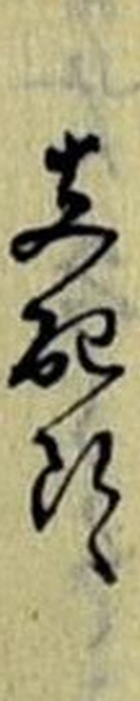支配頭へ
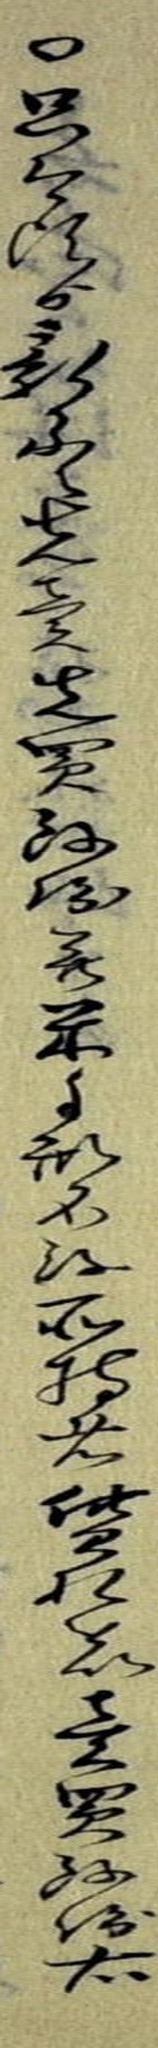〇只今頃ゟ新米之先売先買致儀并米手形不致所持者貸札を以売買致儀右
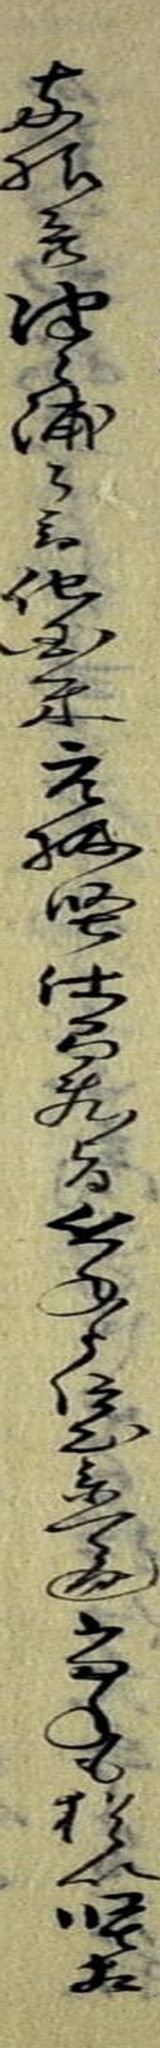両様并津々浦々に而他国米取扱堅仕間敷旨近年被仰出参可通当年も猶以堅相
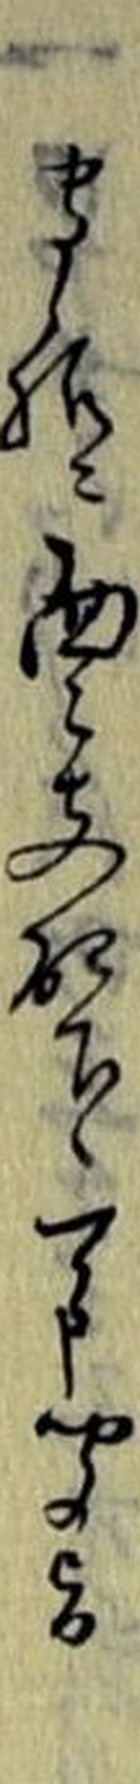守様に面々支配下へ可申聞旨
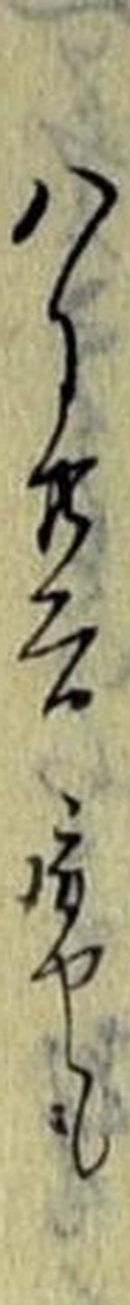九月廿二日府中へも
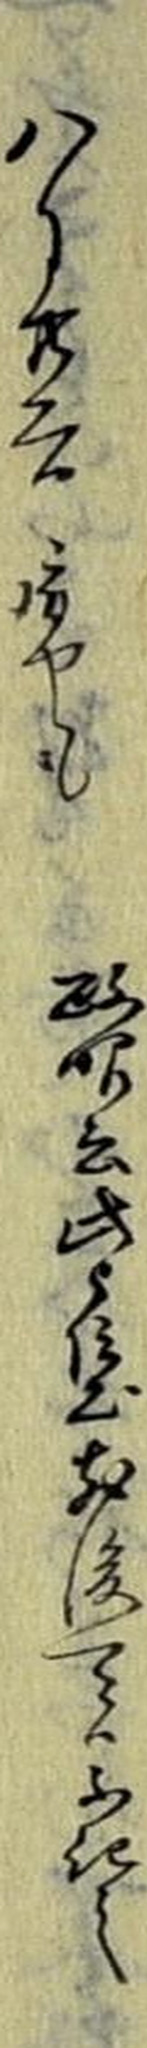八月廿二日府中へも政昭言此被仰出前後一々は不記之
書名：命令之部 二
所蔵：福井県文書館 Fukui Prefectural Archives
